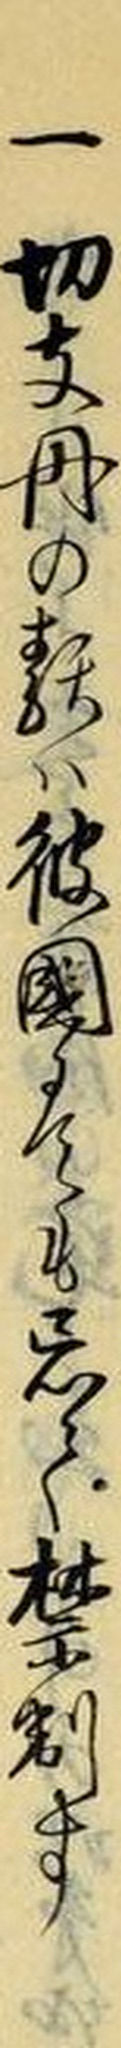一切支丹の類ハ彼国にても忌て禁制す
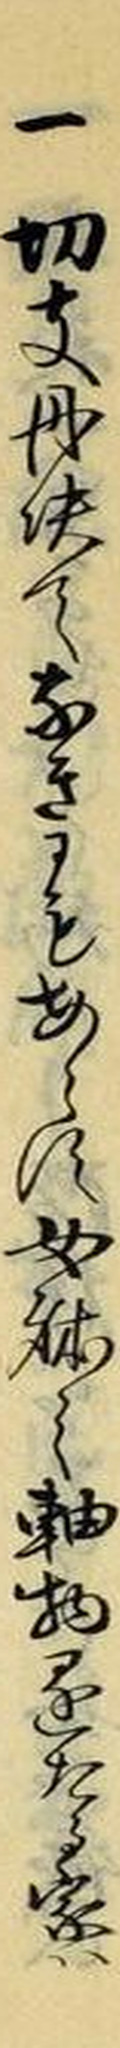一切支丹決てなきにもあらす女躰之軸物懸たる家ハ
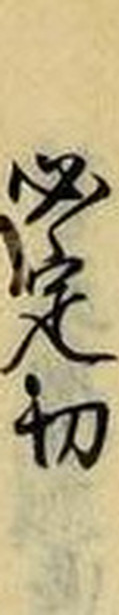必定切
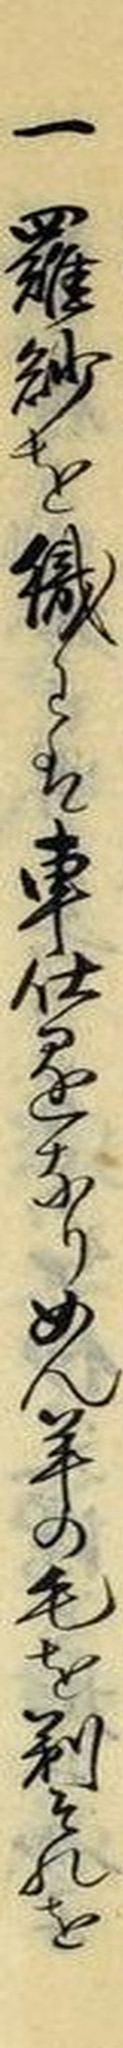一羅紗を織には車仕懸なりめん羊の毛を剃それを
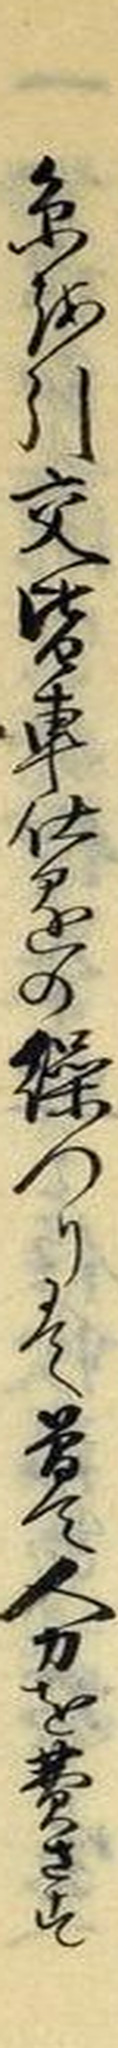糸残引交皆車仕懸の繰つりにて曽て人力を費さす
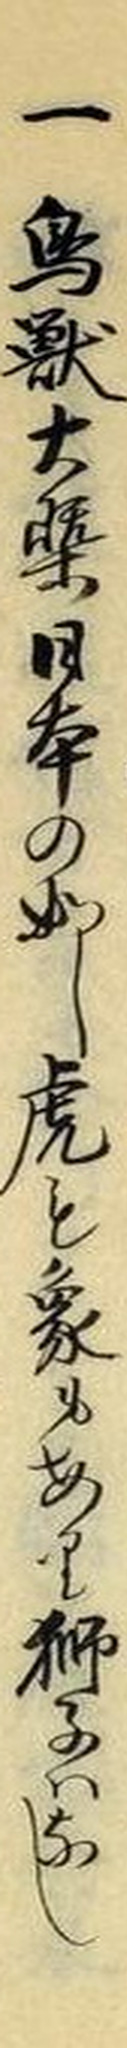一鳥獣大概日本の如し虎も象もあり獅子ハなし
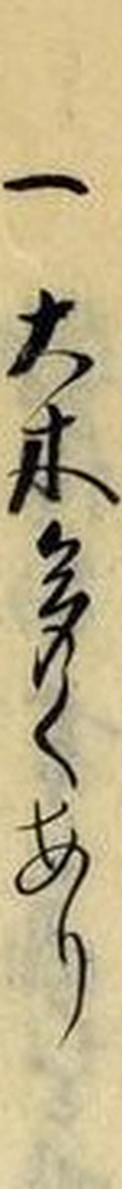一大木多くあり
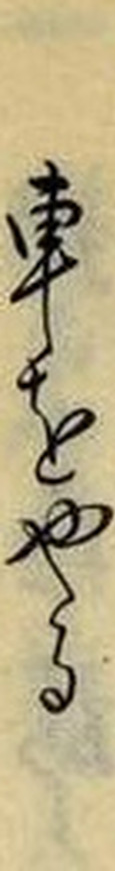車をやる
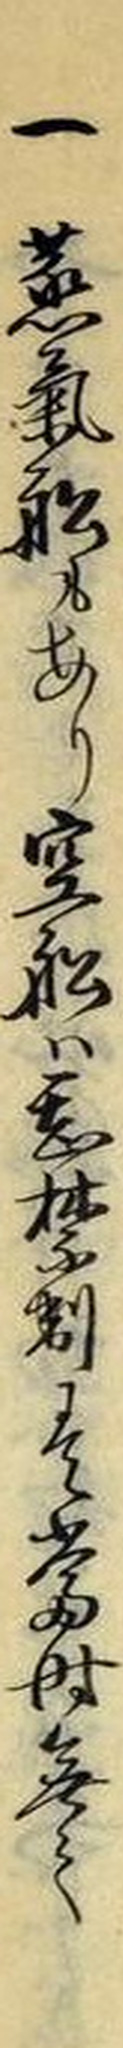一蒸気船もあり空港船ハ甚禁制にて當時無之
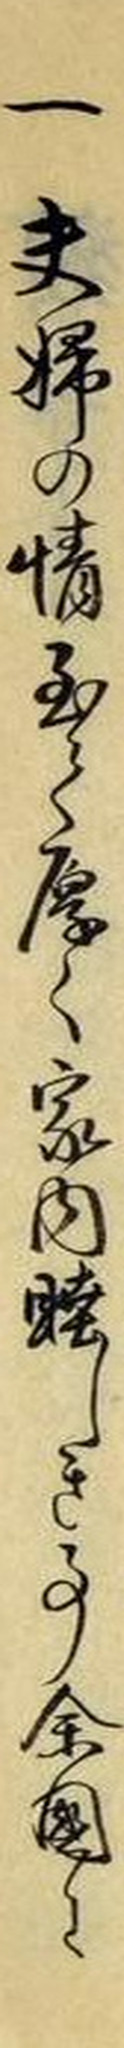一夫婦の情至て厚く家内睦しき事余国に

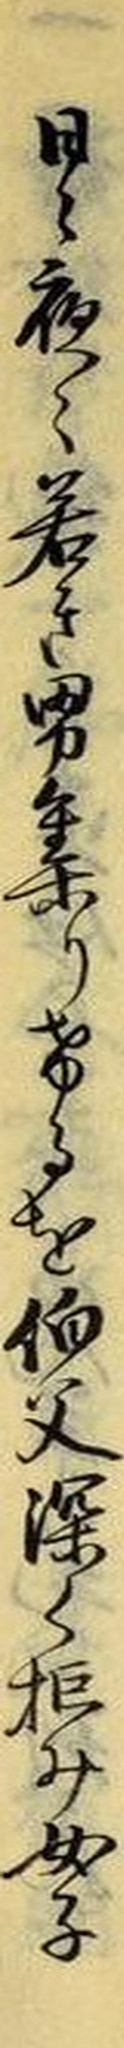日々夜々若き男集りけるを伯父深く拒み女子
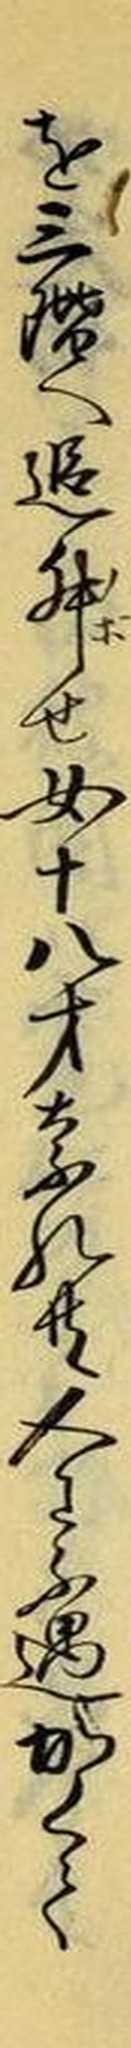を三階へ追升せ女十八才なれ共人に不遇かくて
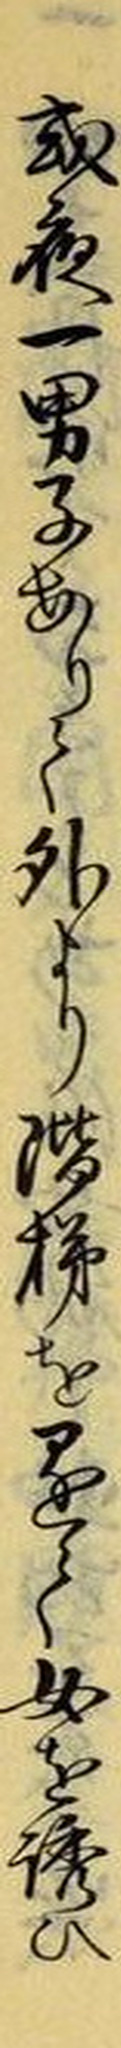或夜一男子ありて外より階梯を懸て女を誘ひ
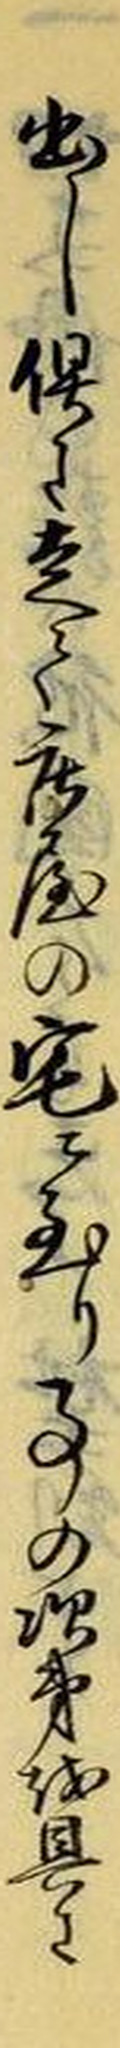出し倶に走て庄屋の宅ニ至り事の次第を具に
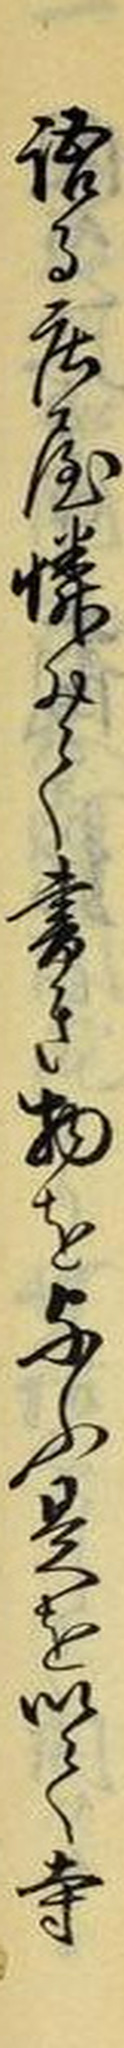語る庄屋憐みて書き物を与ふ是を以て寺
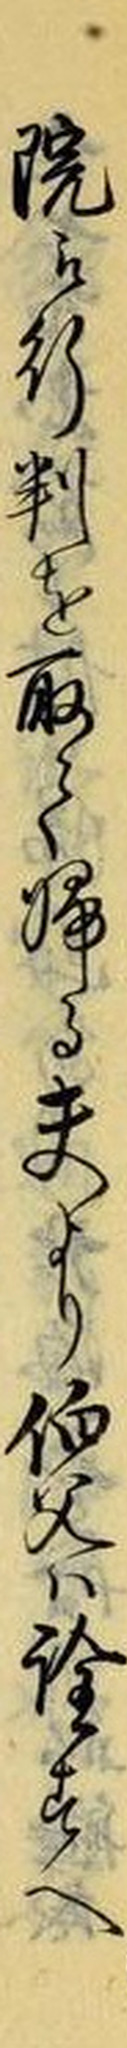院江行判を取て帰る夫より伯父ハ詮すへ
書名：漂客談奇（備考雑録写8）
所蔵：福井県文書館 Fukui Prefectural Archives
